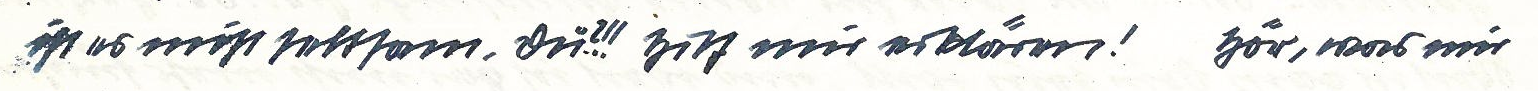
ist es nicht seltsam, Du?!! Hilf mir erklären! Hör, was mir
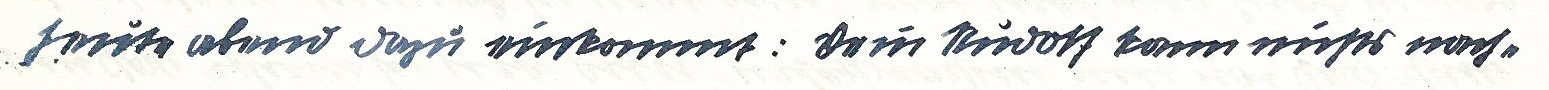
heute abend dazu einkommt: Dein Rudolf kann nichts nach¬
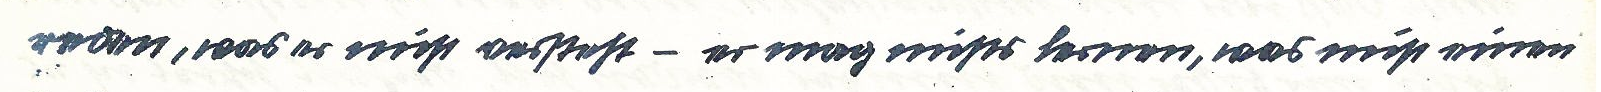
reden, was er nicht versteht – er mag nichts lernen, was nicht einen
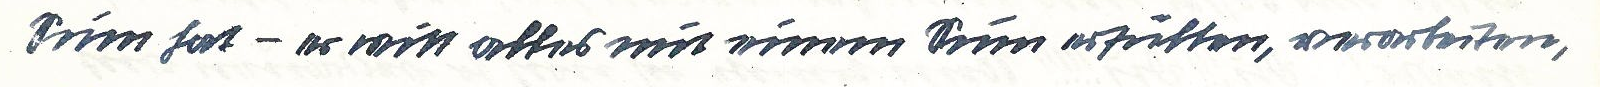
Sinn hat – er will alles mit einem Sinn erfüllen, verarbeiten,
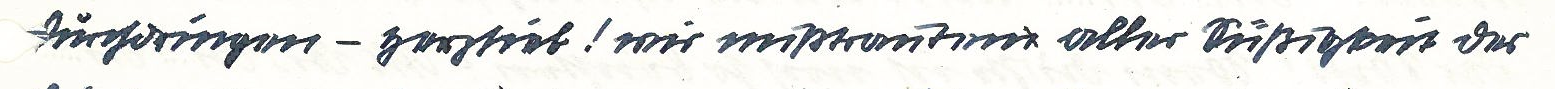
urchdringen – Herzlieb! Wir mißtrautemn aller Süßigkeit der
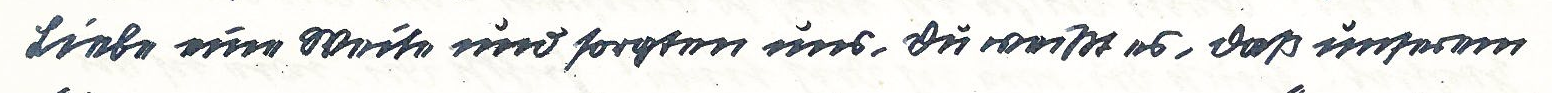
Liebe eine Weile und sorgten uns, Du weißt es, daß unserem
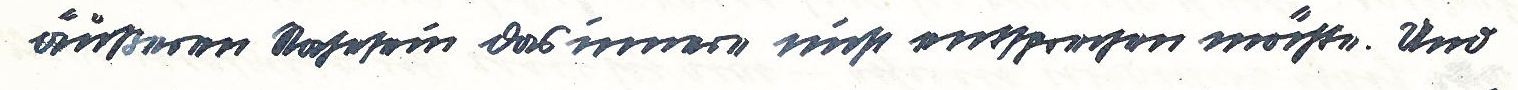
äußeren Nahesein das innere nicht entsprechen möchte. Und
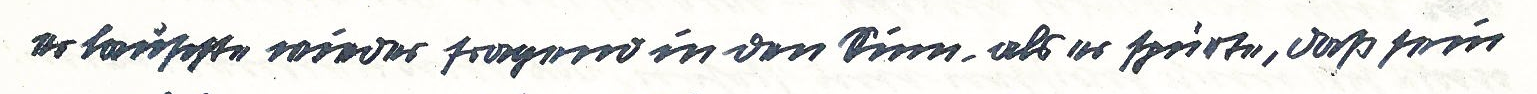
er lauschte wieder fragend in den Sinn, als er spürte, daß sein
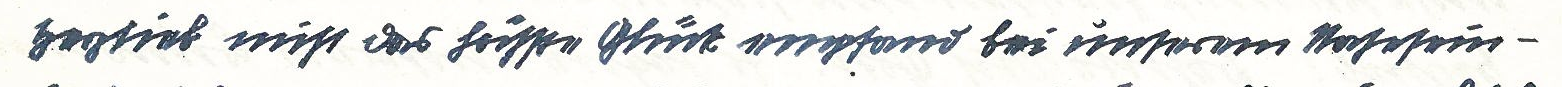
Herzlieb nicht das höchste Glück empfand bei unserem Nahesein –
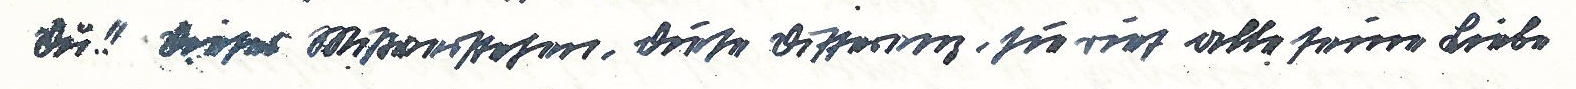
Du!! Dieses Mißverstehen, diese Differenz, sie rief alle seine Liebe
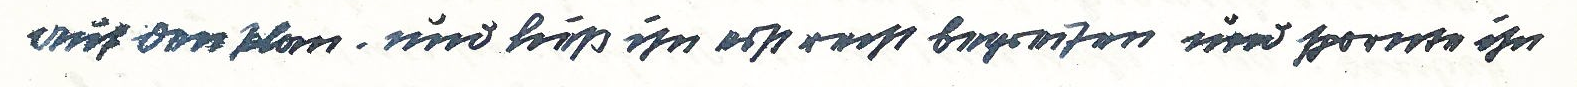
auf den Plan, und ließ ihn erst recht begreifen und spornte ihn
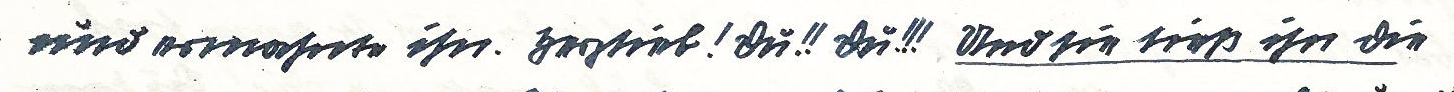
und ermahnte ihn. Herzlieb! Du!! Du!!! Und sie ließ ihn die
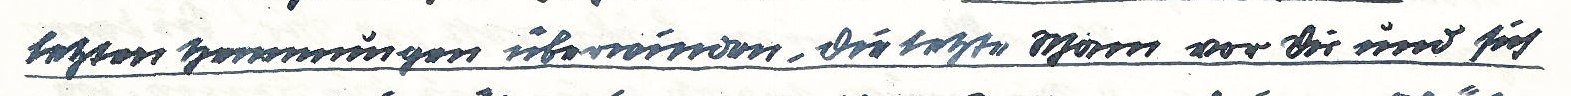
letzten Hemmungen überwinden, die letzte Scham vor Dir und sich
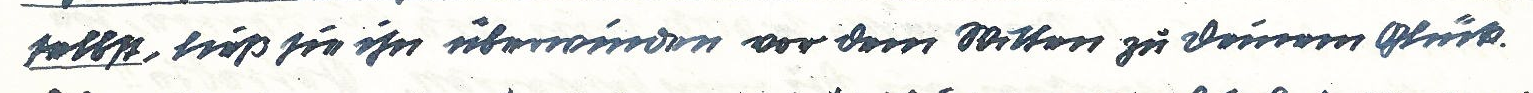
selbst, ließ sie ihn überwinden vor dem Willen zu Deinem Glück.
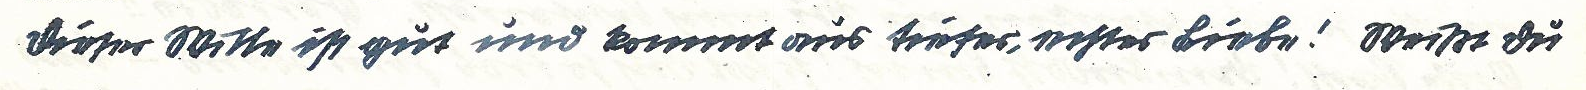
Dieser Wille ist gut und kommt aus tiefer, echter Liebe! Weißt Du
